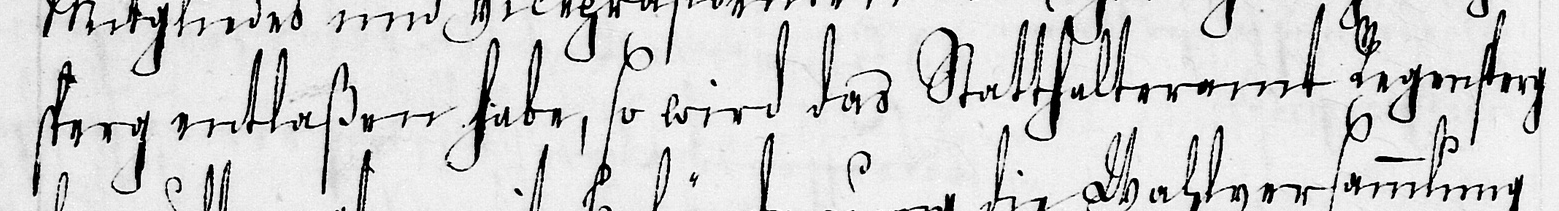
sperg entlaßen habe, so wird das Statthalteramt Regensperg
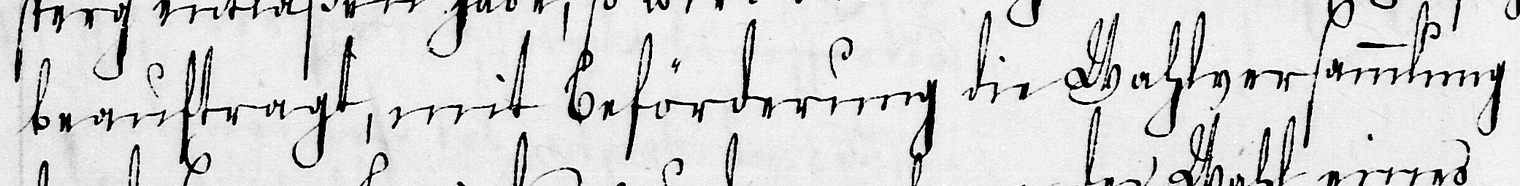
beauftragt, mit Beförderung die Wahlversammlung
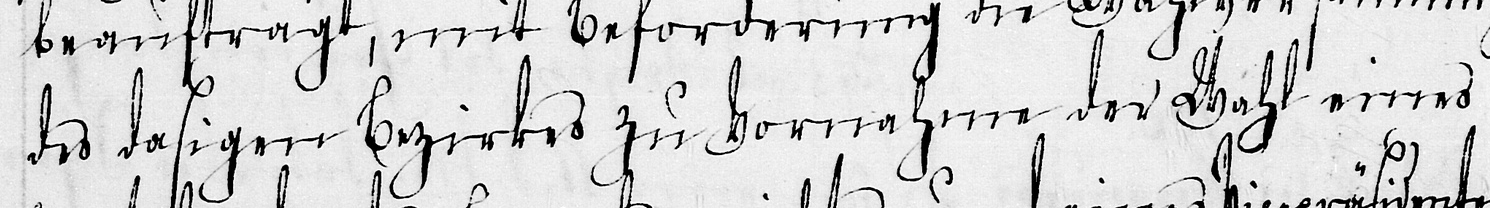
des dasigen Bezirkes zu Vornahme der Wahl eines
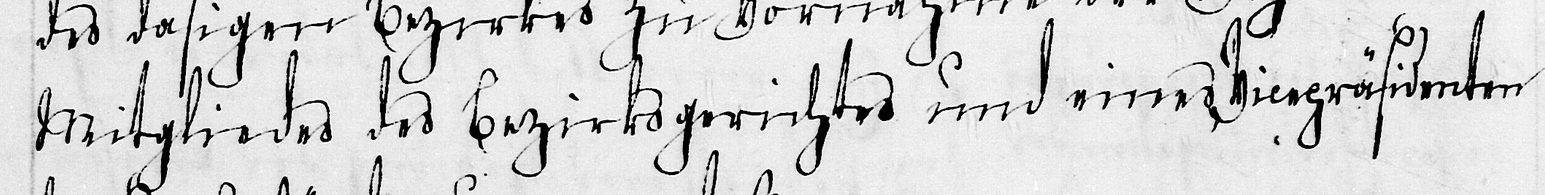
Mitgliedes des Bezirksgerichtes und eines Vicepräsidenten
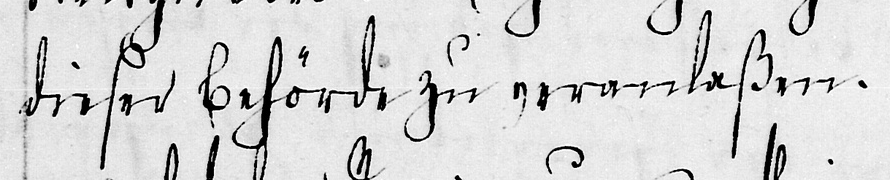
dieser Behörde zu veranlaßen.
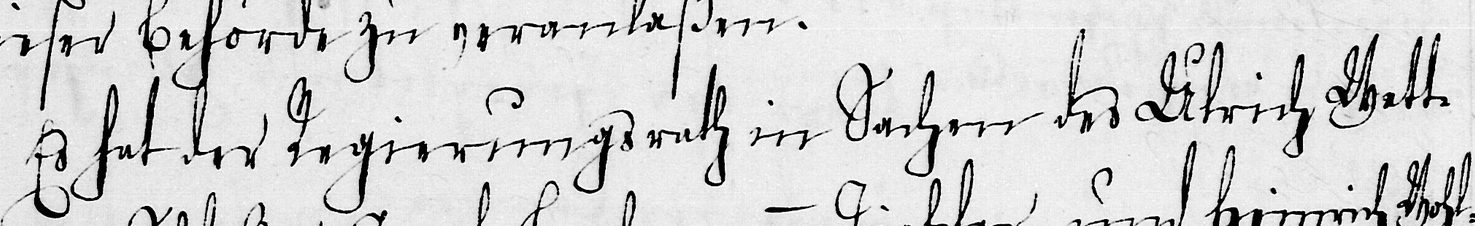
Es hat der Regierungsrath in Sachen des Ulrich Wett¬
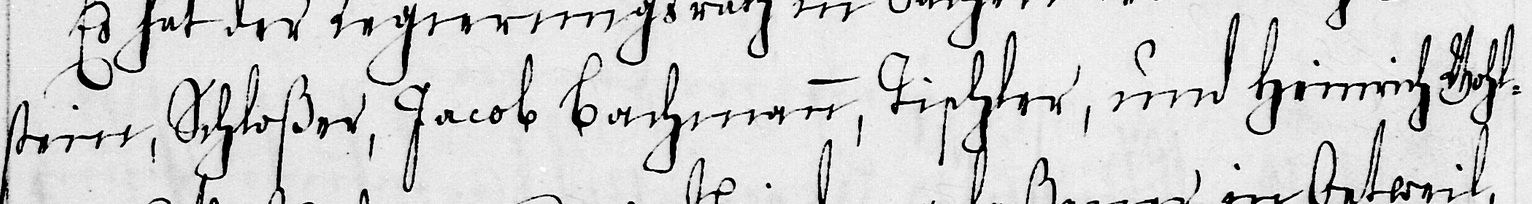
stein, Schloßer, Jacob Bachmann, Tischler, und Heinrich Wohl¬
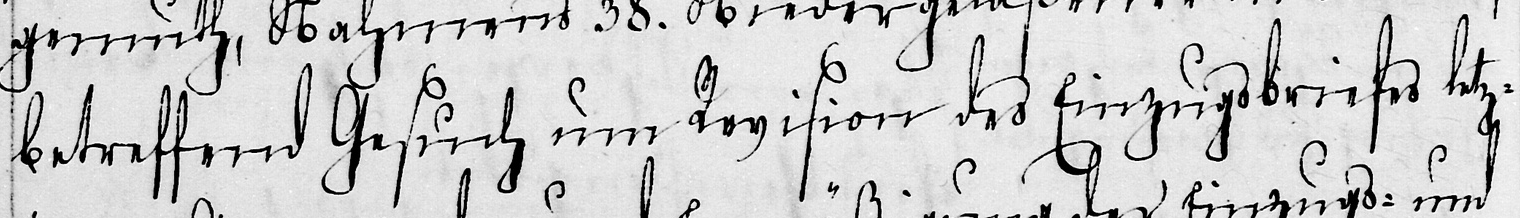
betreffend Gesuch um Revision des Einzugsbriefes let¬
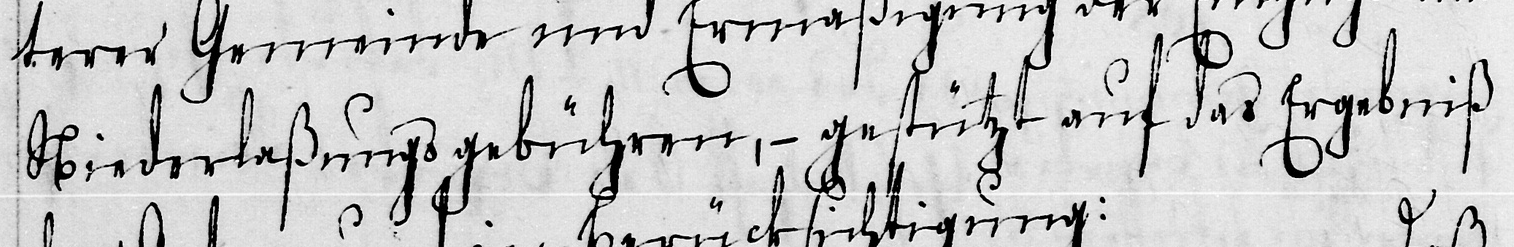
Niederlaßungsgebühren, – gestützt auf das Ergebniß
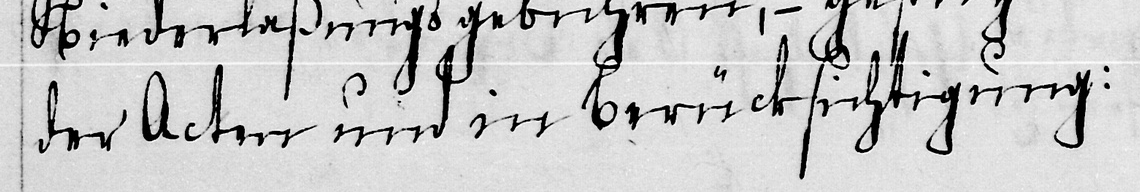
der Acten und in Berücksichtigung:
